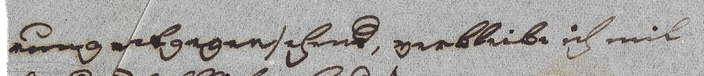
rung entgegensehend, verbleibe ich mit
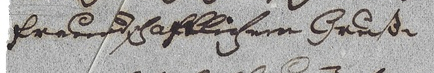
freundschaftlichem Gruße
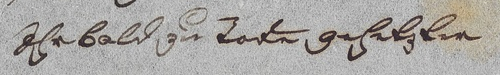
Ihr bald zu Tode gehetzter
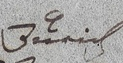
Zürich
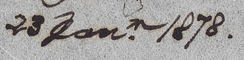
23. Janr 1878.
